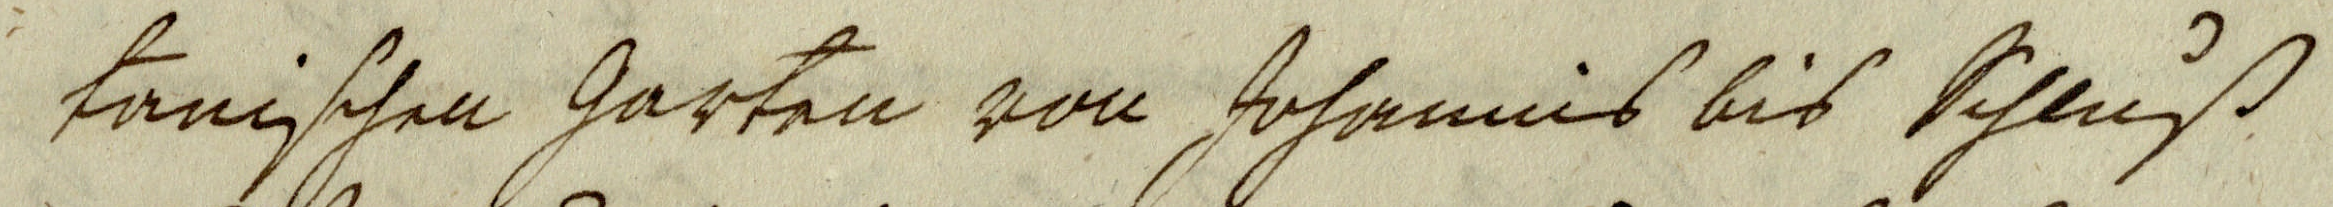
tanischen Garten von Johannis bis Schluß
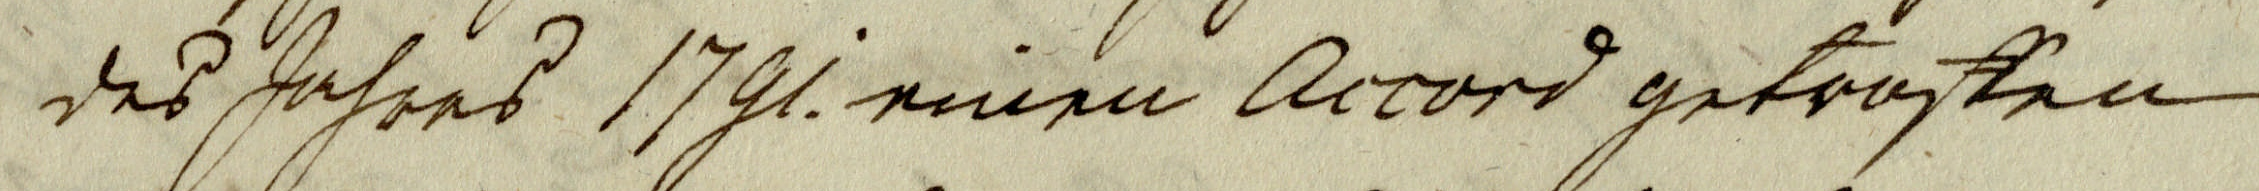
des Jahres 1791. einen Accord getroffen
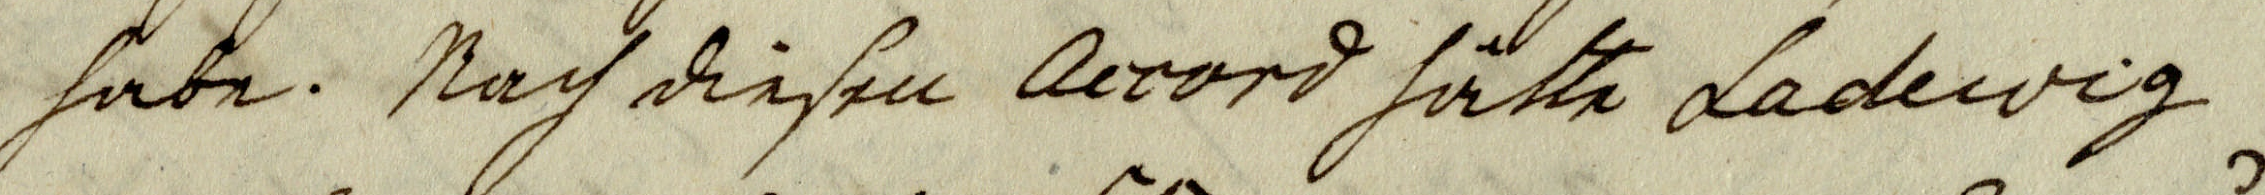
habe. Nach diesem Accord hätte Ladewig
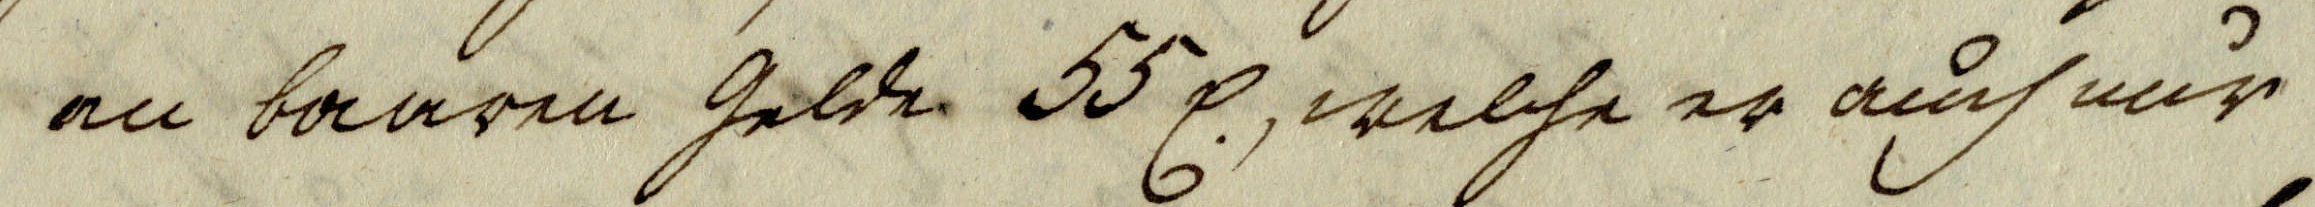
an baaren Gelde 55 rtl., welche er auch nur
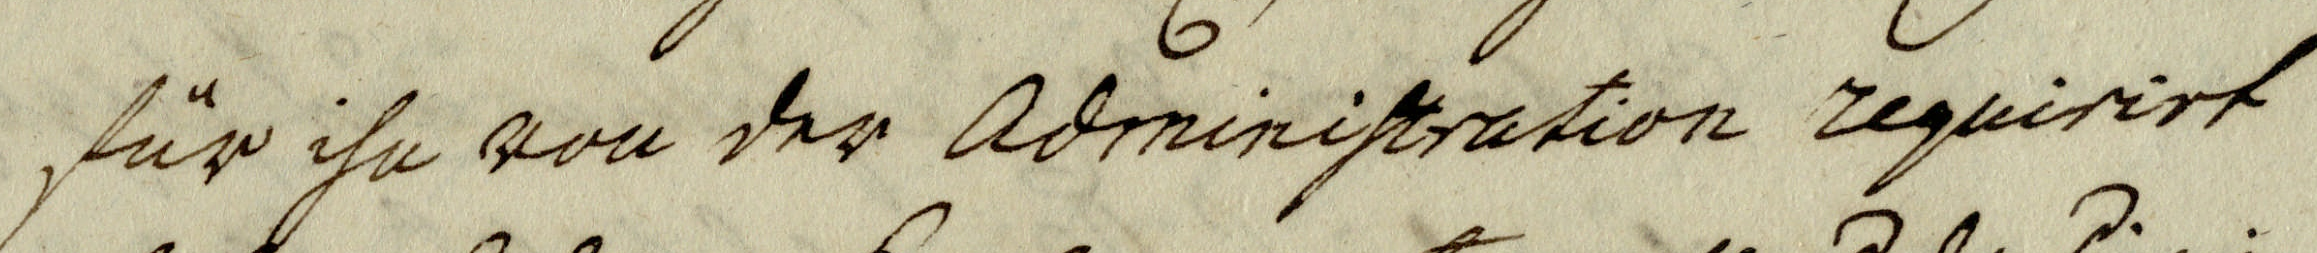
für ihn von der Administration requirirt
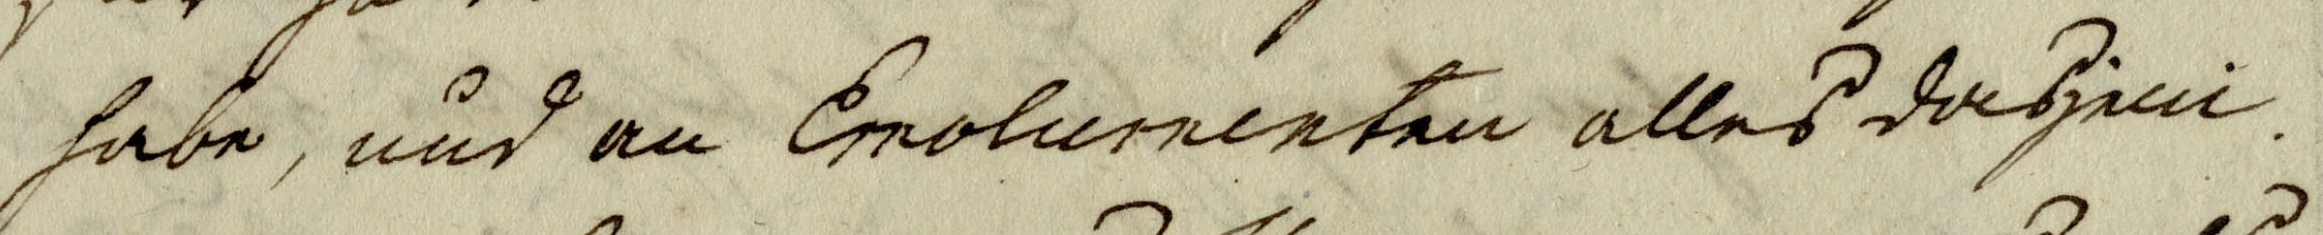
habe, und an Emolumenten alles dasjeni¬
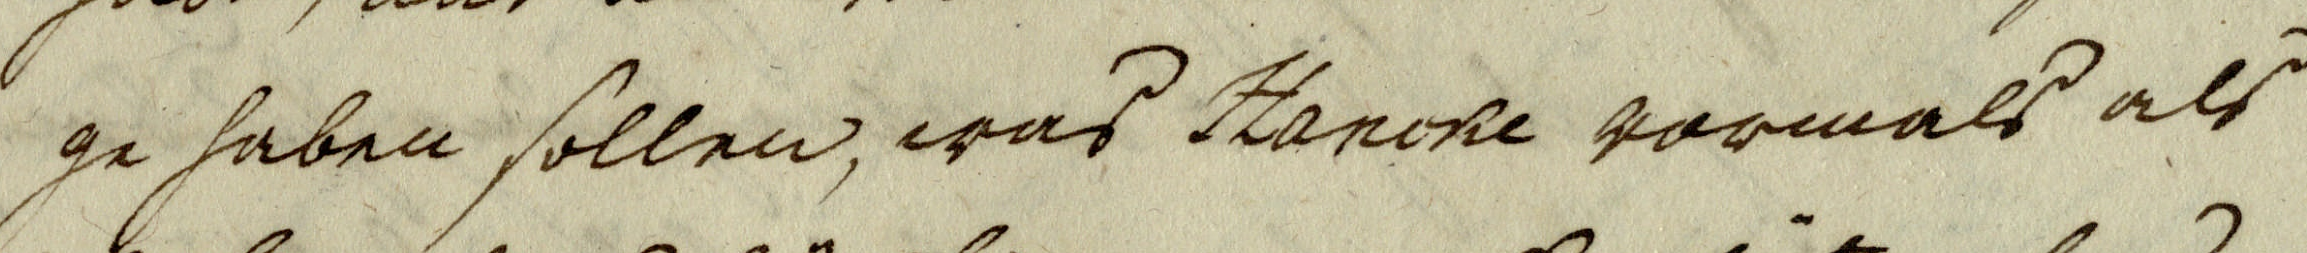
ge haben sollen, was Hancke vormals als
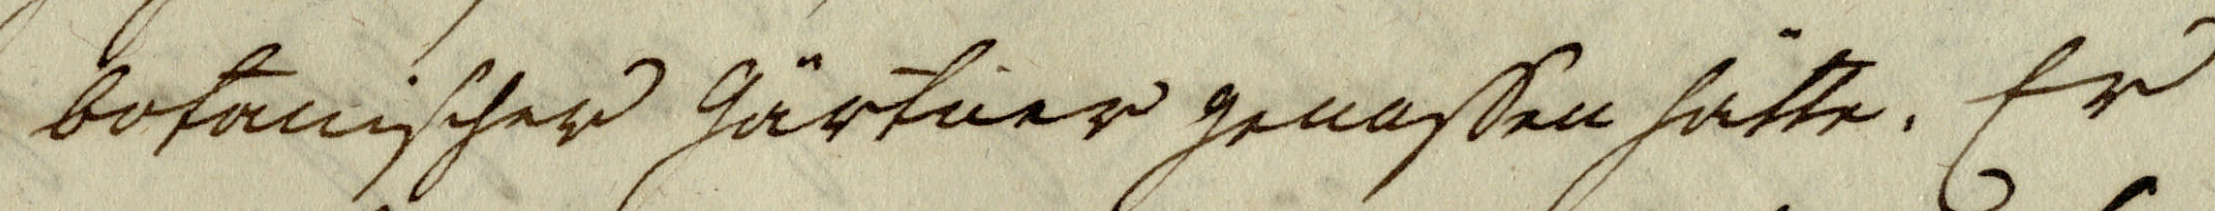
botanischer Gärtner genossen hätte. Er
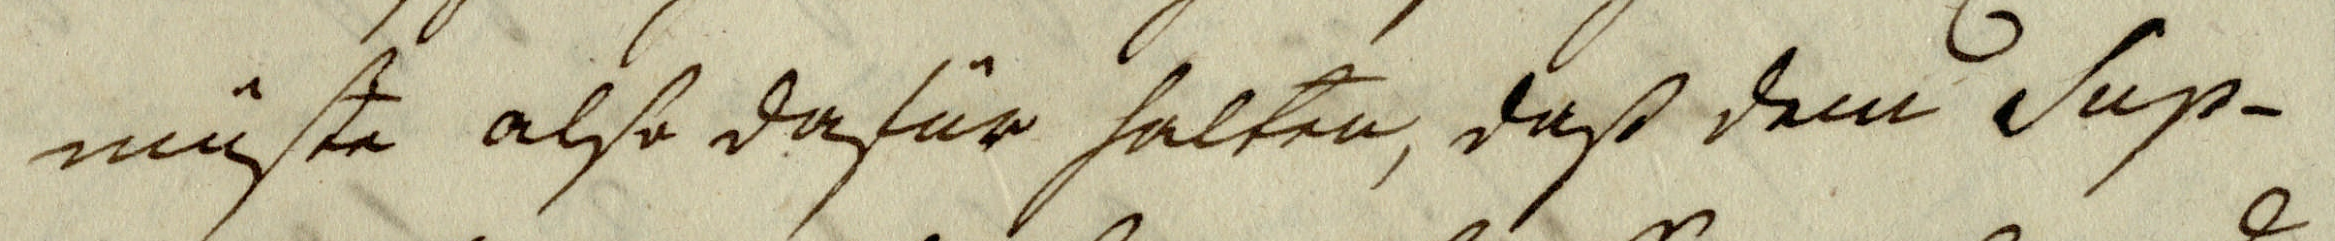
müsste also dafür halten, daß dem Sup¬
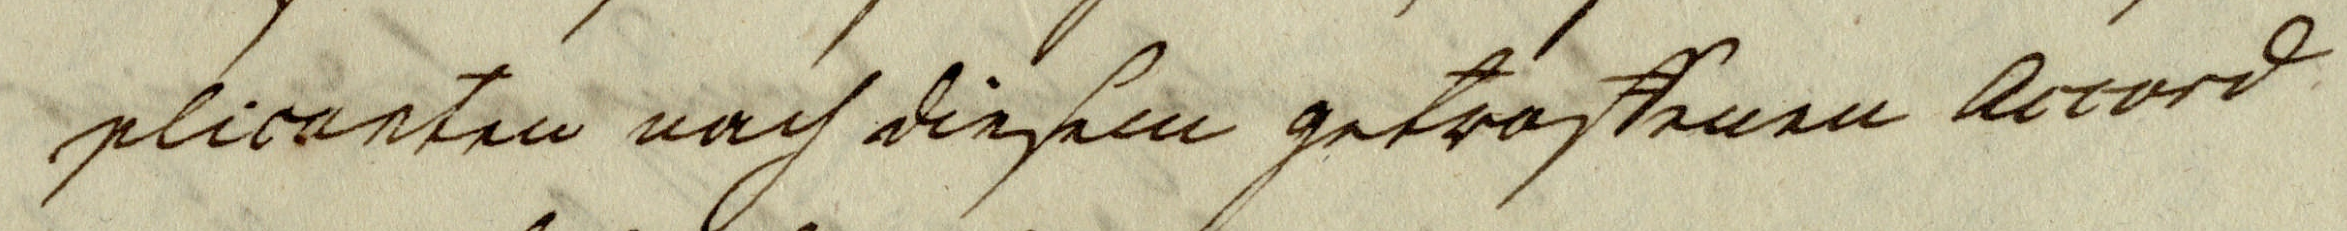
plicanten nach diesem getroffenen Accord
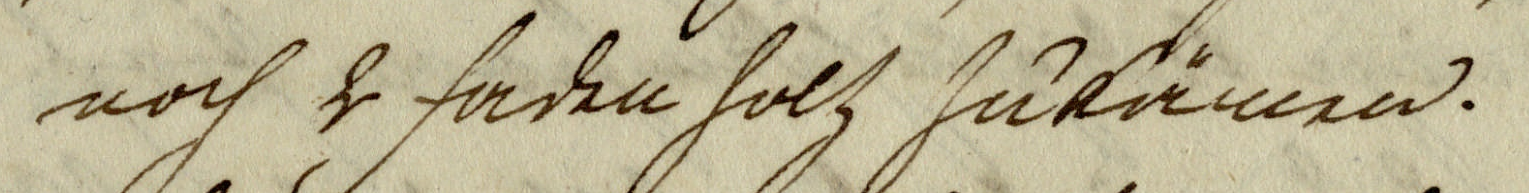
noch 2 Faden Holz zukämen.
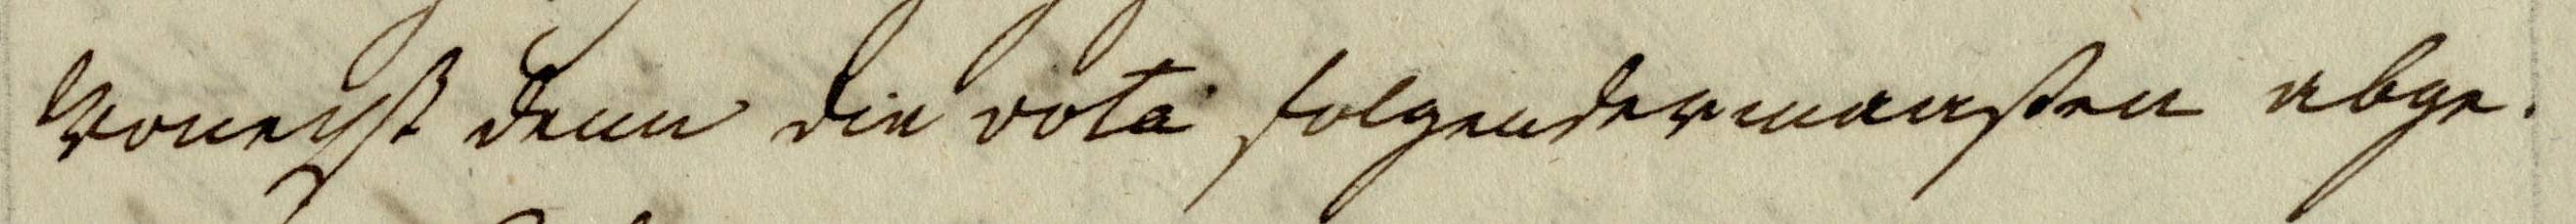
Wonechst denn die vota folgendermaaßen abge¬
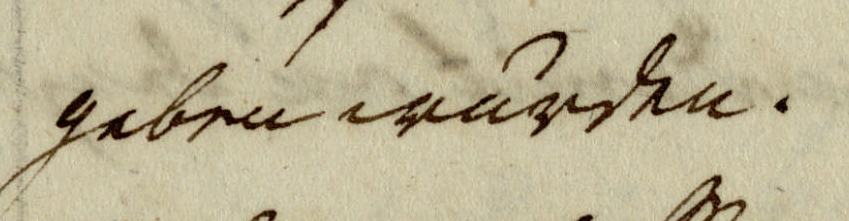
geben wurden.
